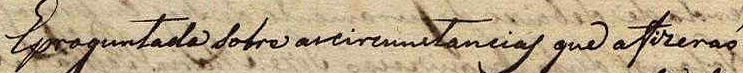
E proguntada sobre as circunstancias que a fizeraõ
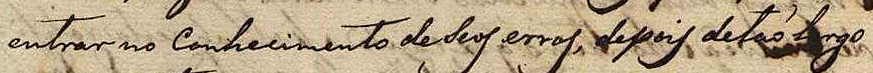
entrar no conhecimento de seos erros, depois de taõ largo
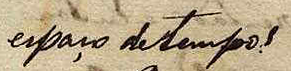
espaço de tempo?
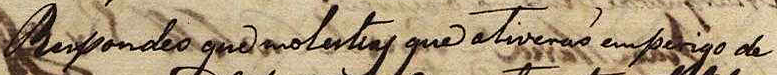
Respondeo que molestias que a tiveraõ em perigo de
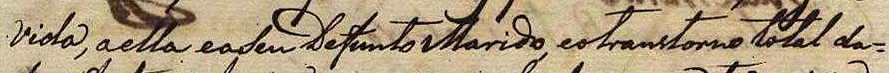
vida, a ella, e a seu defunto Marido, e o transtorno total da
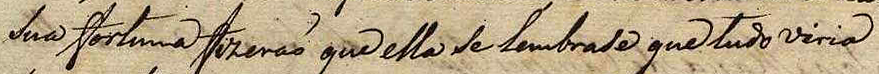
sua fortuna fizeraõ que ella se lembrase que tudo viria
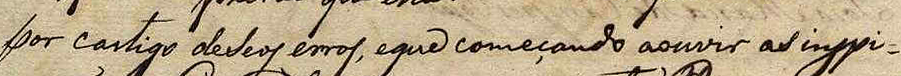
por castigo de seos erros, e que começando a ouvir as inspi
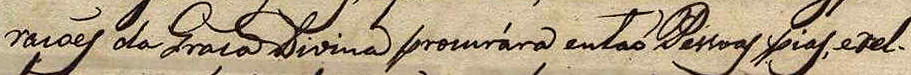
raçoẽs da Graça Divina procurára entaõ Pessoas pias, e rel
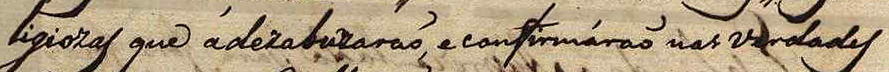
ligiozas que a dezabuzaraõ, e confirmáraõ nas verdades
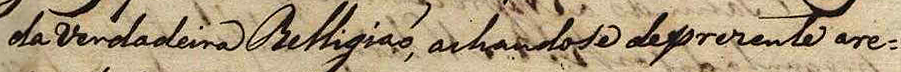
da verdadeira Relligiaõ, achando-se de prezente are
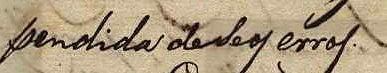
pendida de seos erros.
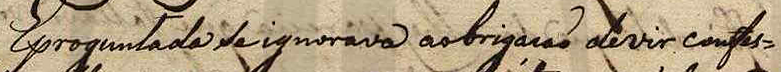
E proguntada se ignorava a obrigaçaõ de vir confes
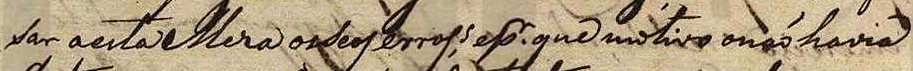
sar a esta Meza os seos erros? e pr. que motivo o naõ havia
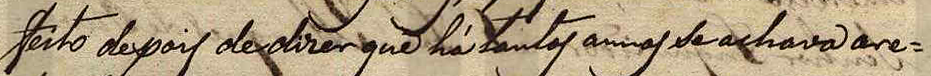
feito depois de dizer que há tantos annos se achava are
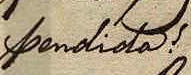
pendida?
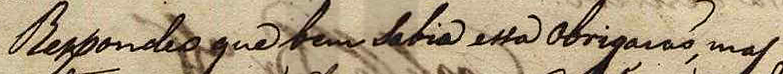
Respondeo que bem sabia essa obrigaçaõ, mas
